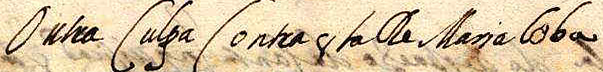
Outra Culpa Contra esta Re Maria loba
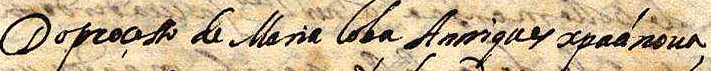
Do proçesso de Maria loba Anrriques xpaã noua
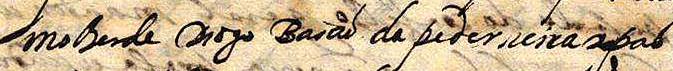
molher de Diogo Baraõ da pederneira xpaõ
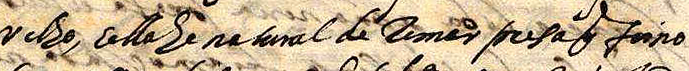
velho, E ella ha natural de Tomar presa q̄ foi no
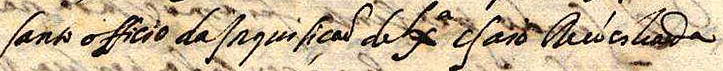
santo officio da Jnquisiçaõ de lxa e saio Recōciliada
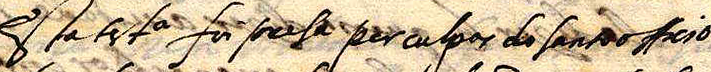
Esta testa foi presa por culpas do santo officio
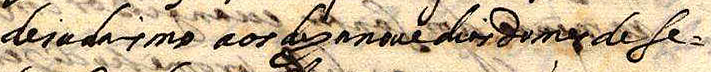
de iudaismo aos dezanoue dias do mes de se
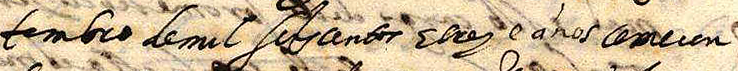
tembro de mil seiscentos E treze an̄os comecou
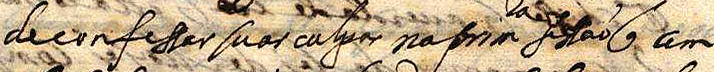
de confessar suas culpas na primra sessaõ q̄ com
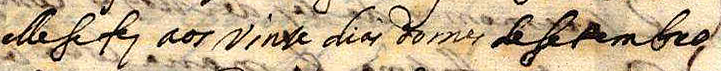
elle se fez aos vinte dias do mes de setembro
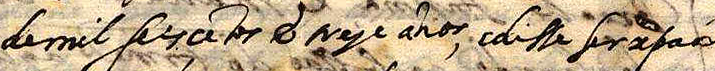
de mil seisçētos & treze an̄os, e disse ser xpaã
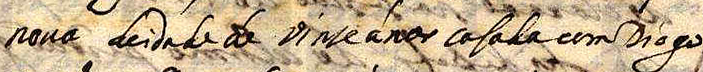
noua de idade de vinte an̄os casada com Diogo
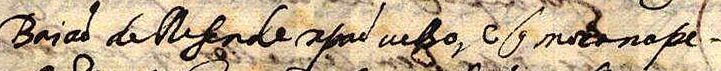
Baiaõ de Resende xpaõ uelho, e q̄ mora na pe
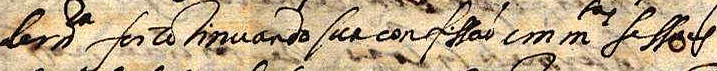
dernra foi cōtinuando sua confissaõ em mtas sessoẽs
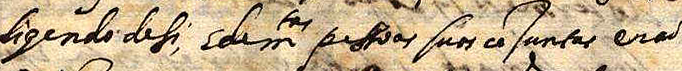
dizendo de si, E de mtas pessoas suas cōjuntas e naõ
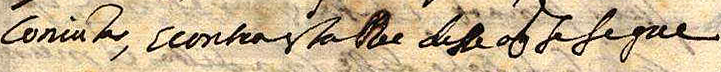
coniūtas, E contra esta Ree desse o q̄ se segue
